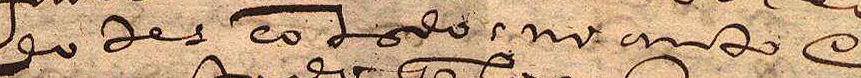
dotes c̄otados no auto e
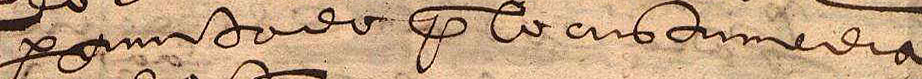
ꝑgumtado p̄lo custume dise
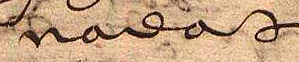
nada
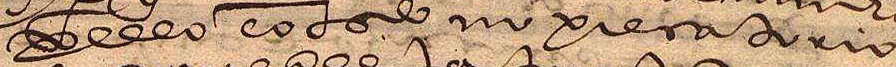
pello cōtado no precatorio
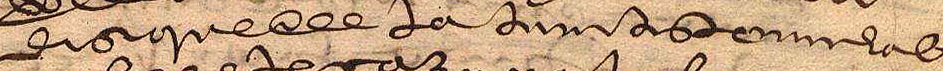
dise que ele ta tem testemunhado
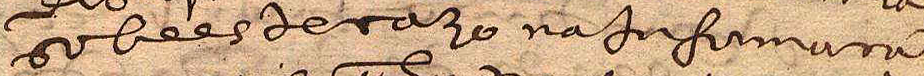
sobre este cazo na Jnformaçā
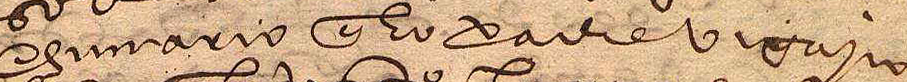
e sumario q̄ ho padre vigajro
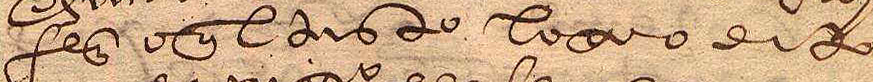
fez o q̄l testo loguo dito
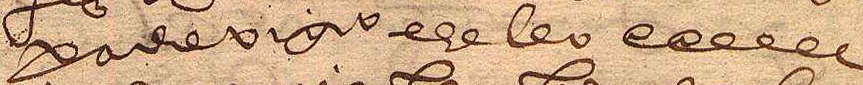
padre vigro lhe leo e e elle
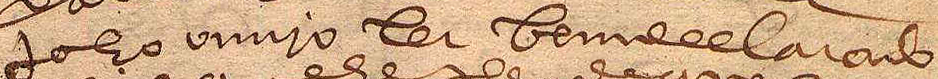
ta ho ouujo ler bem declarado
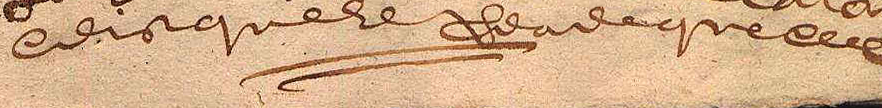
e dise que he ꝟdade que elle
